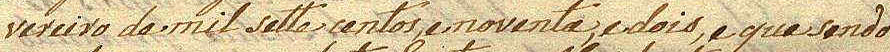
vereiro de mil sette centos e noventa, e dois, e que sendo
